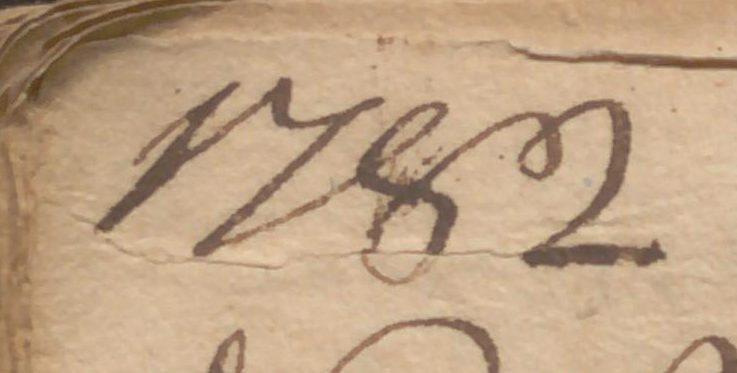1782
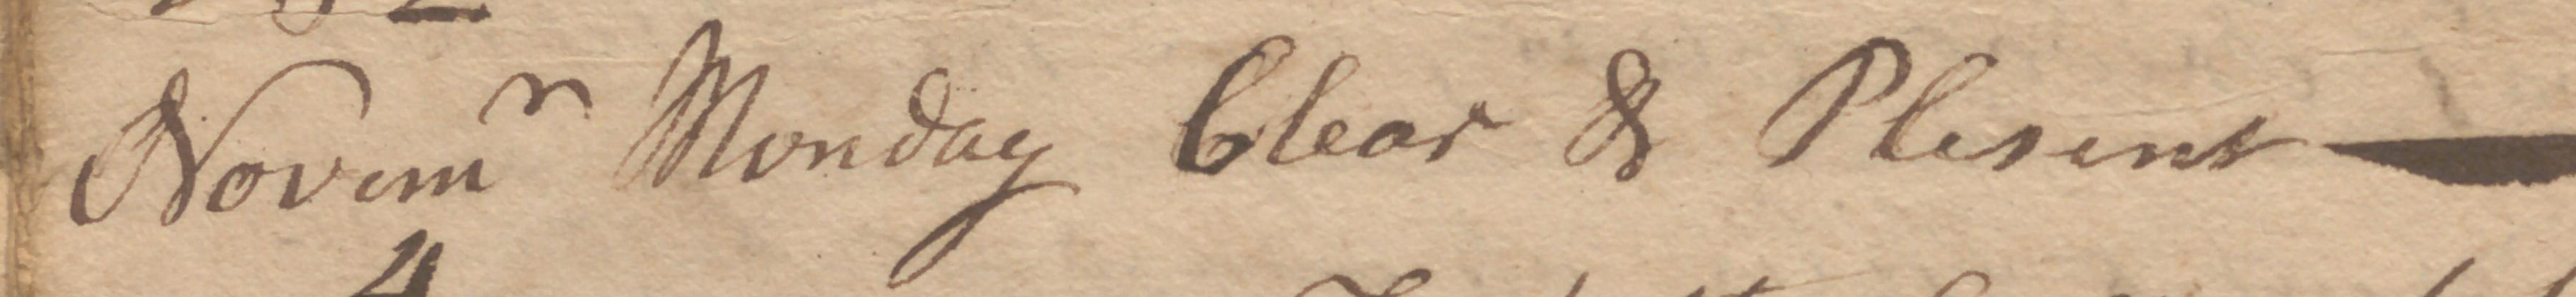Novem^r Monday Clear & Plesent
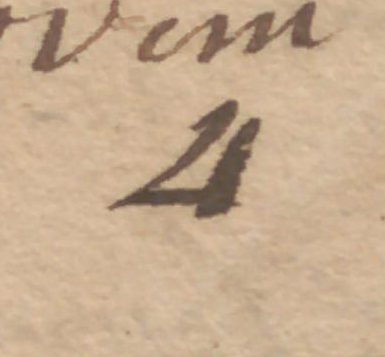4
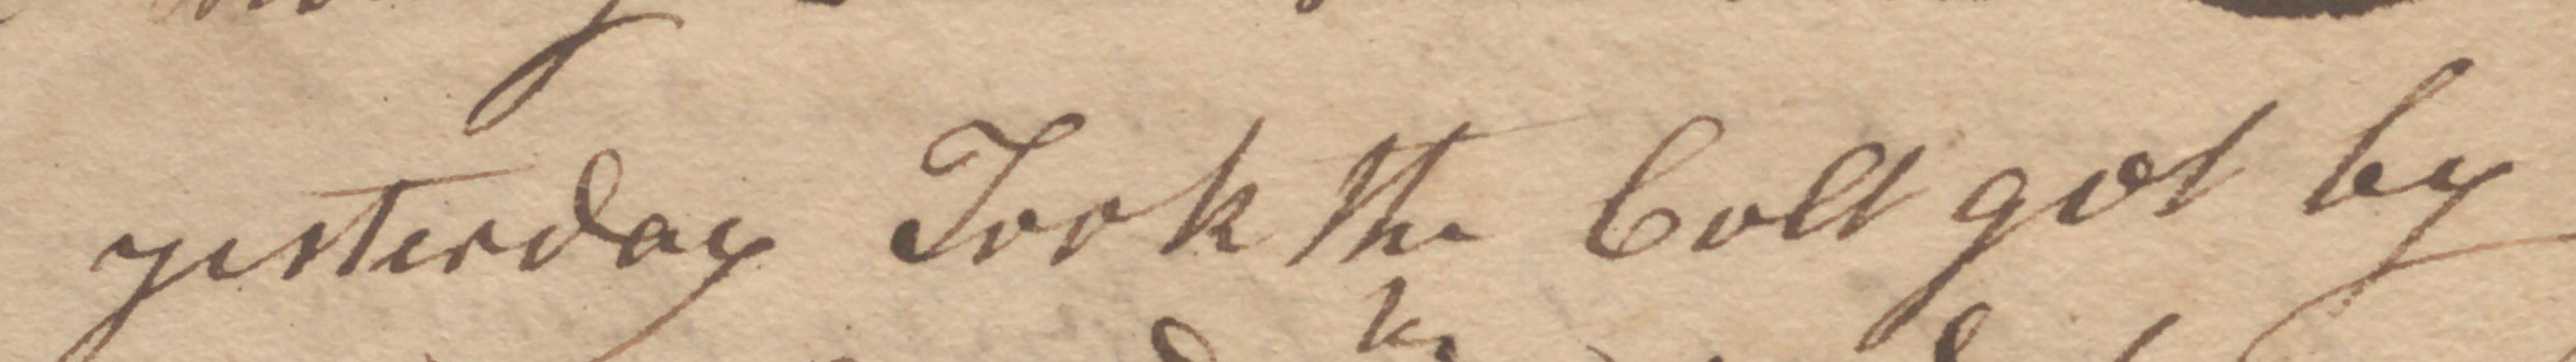yesterday Took the Colt got by
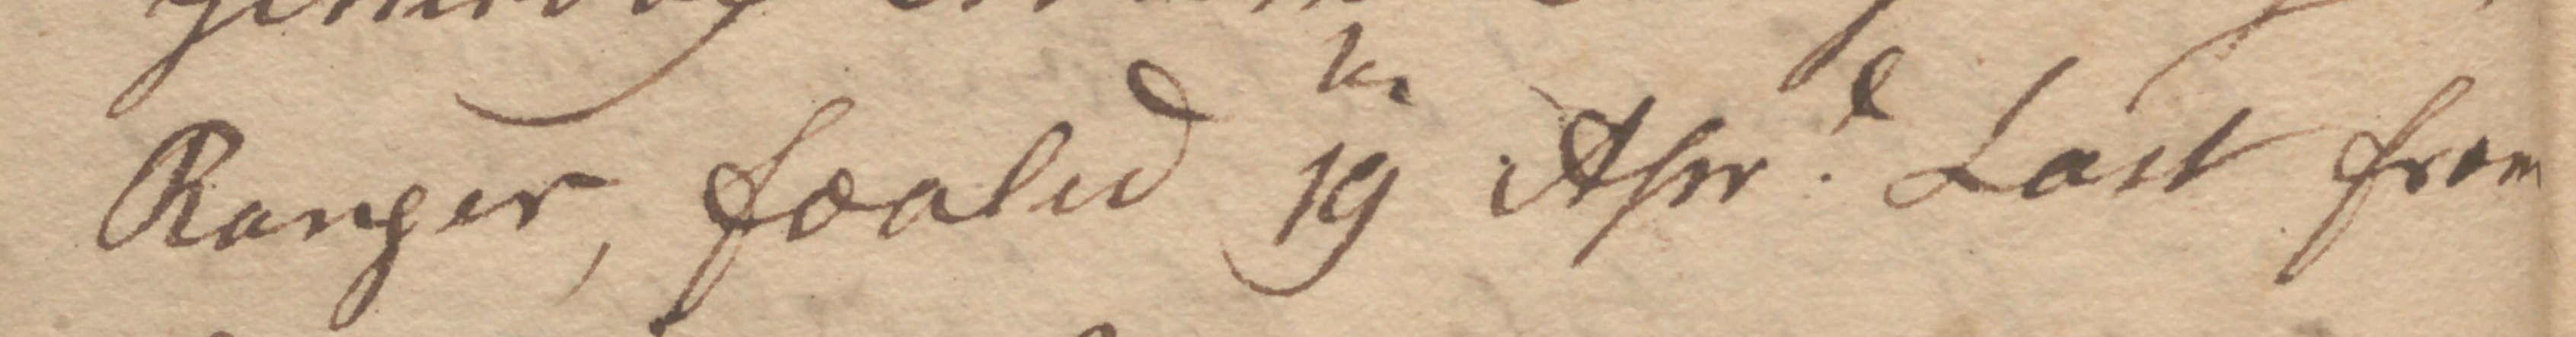Ranger, foaled 19^th Apr^l. Last from
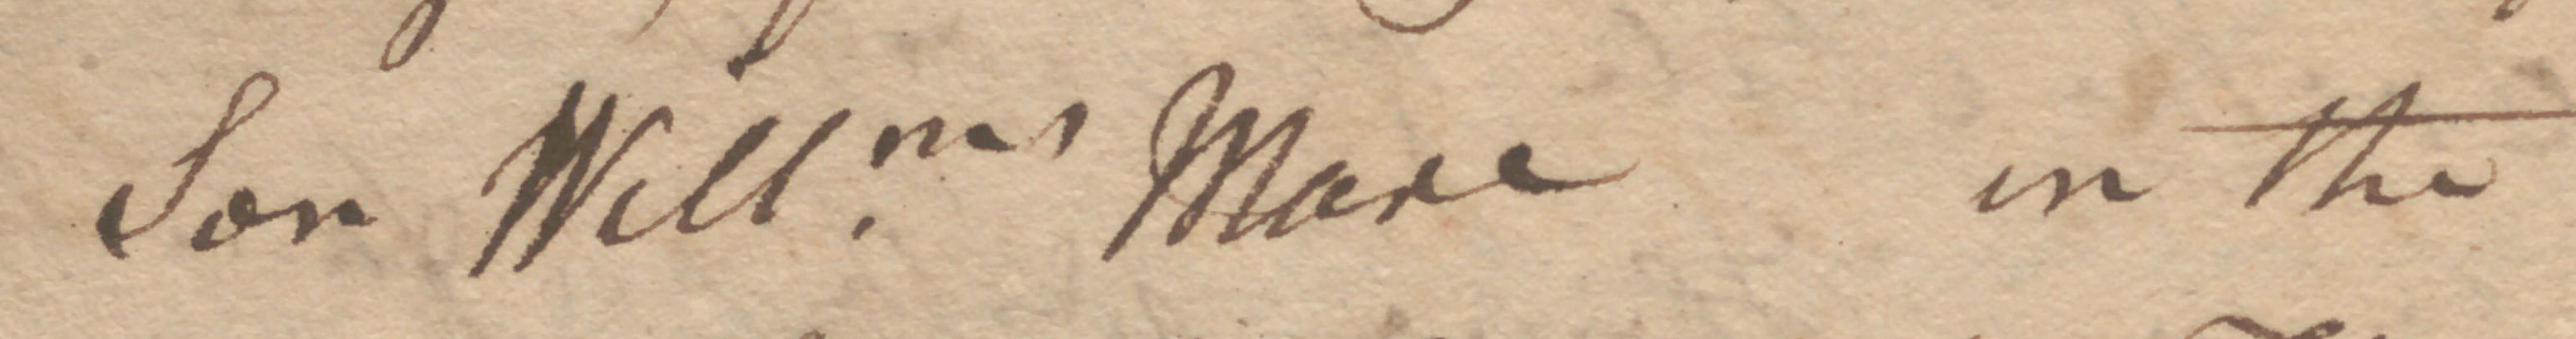Son Will^m. Mare, in the
